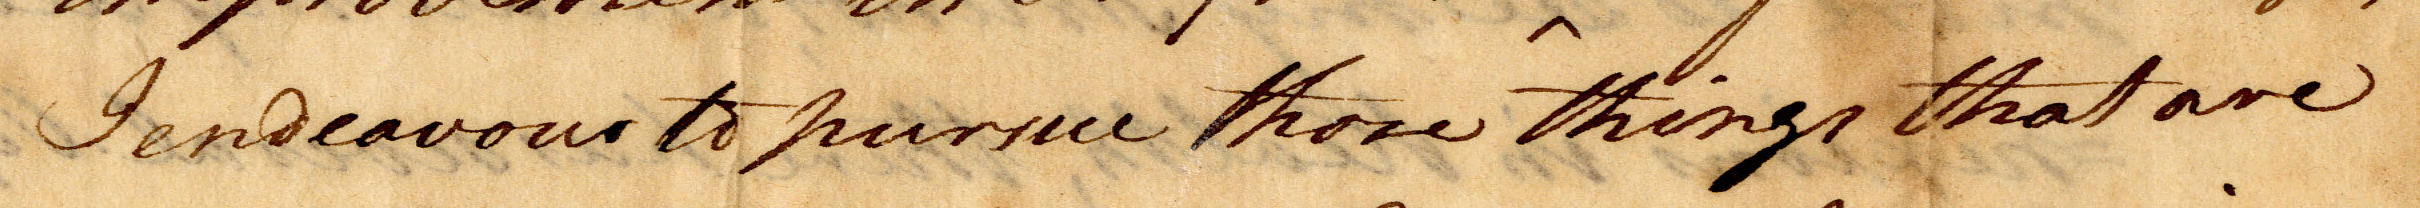I endeavour to pursue those things that are
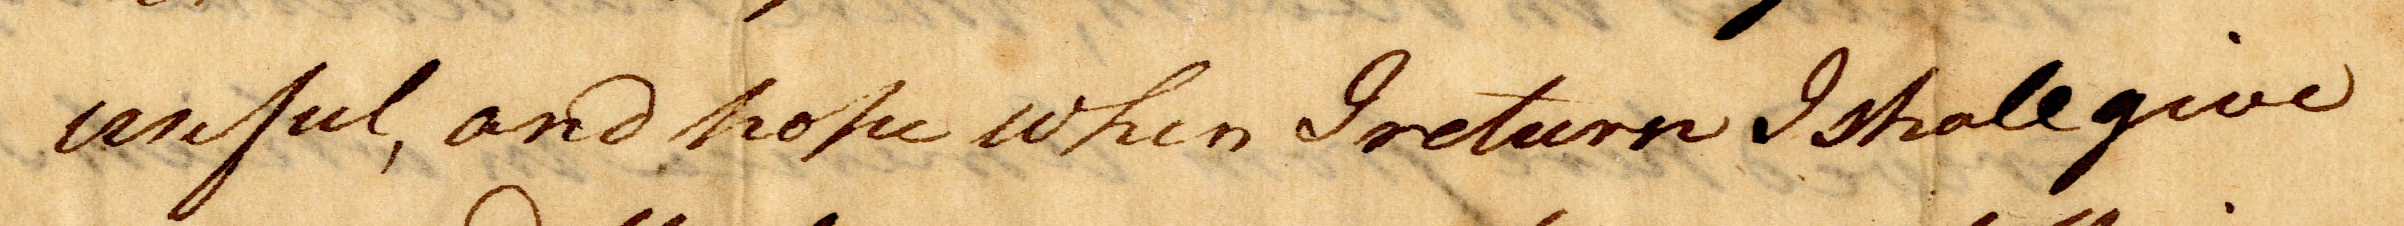useful, and hope when I return I shall give
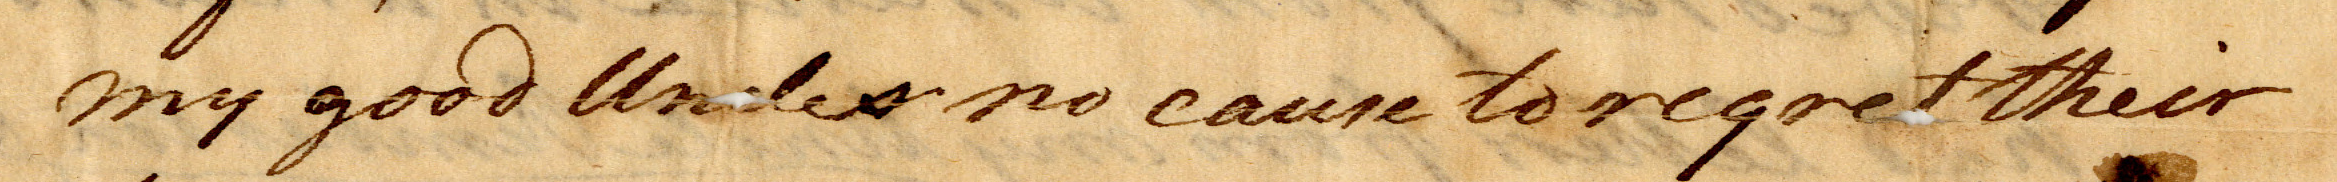my good Uncles no cause to regret their
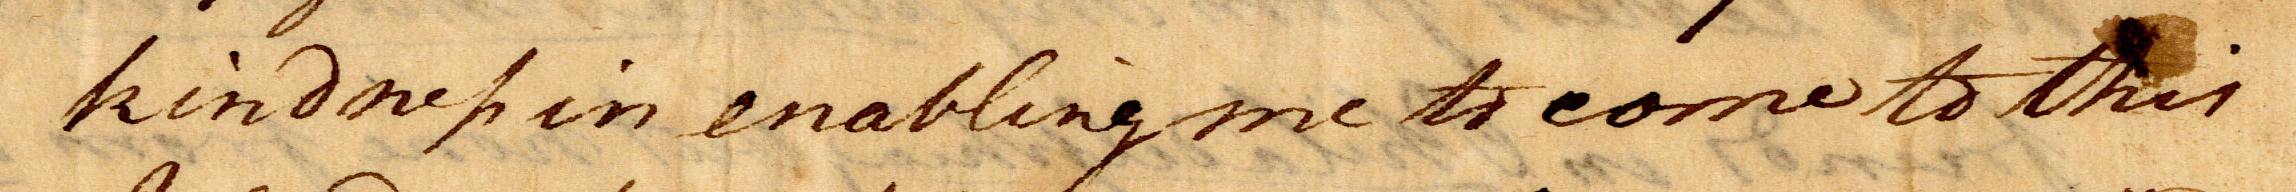kindness in enabling me to come to this
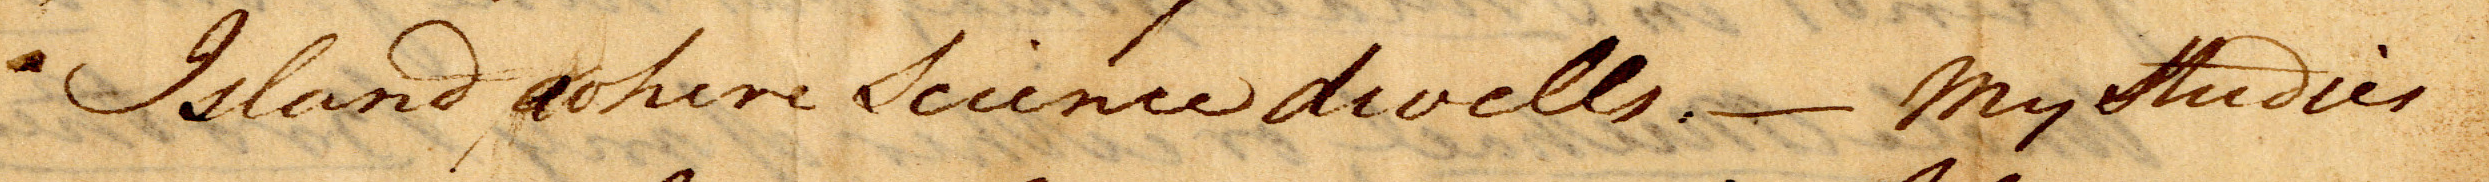Island where Science dwells.- My studies
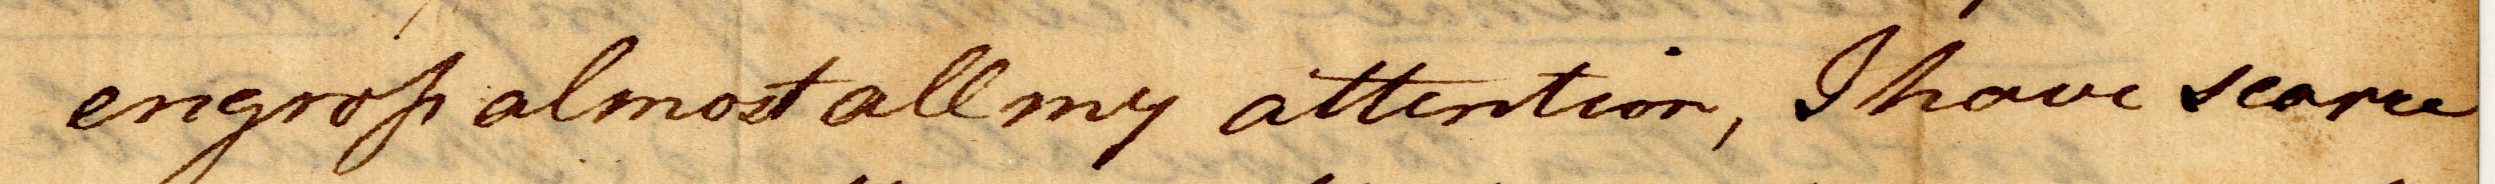engross almost all my attention, I have scarce
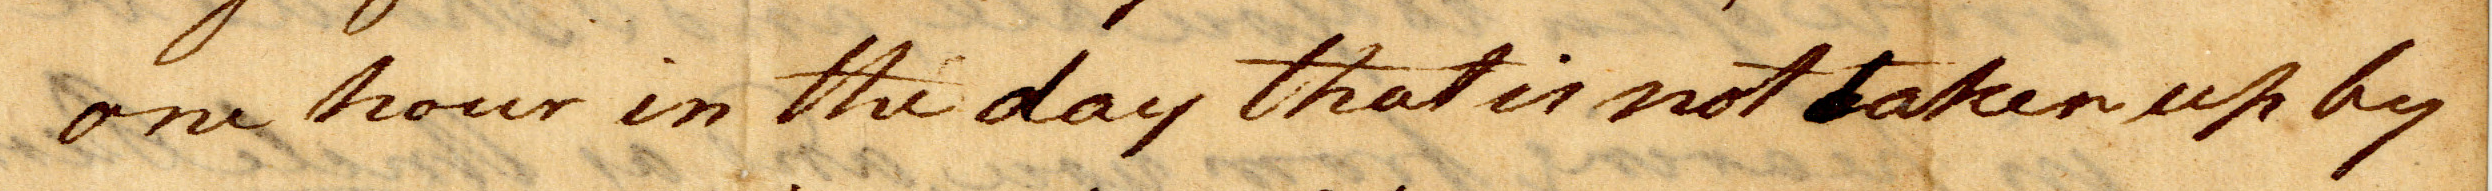one hour in the day that is not taken up by
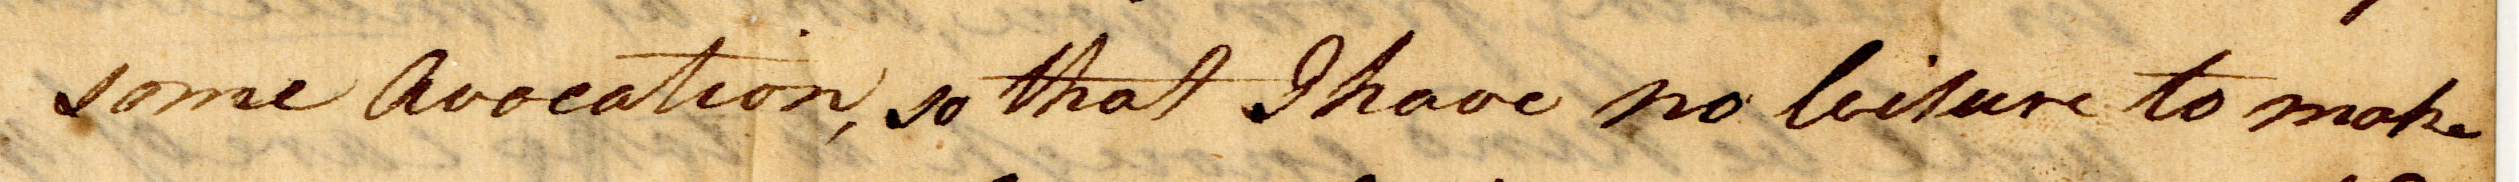some Avocation, so that I have no leisure to make
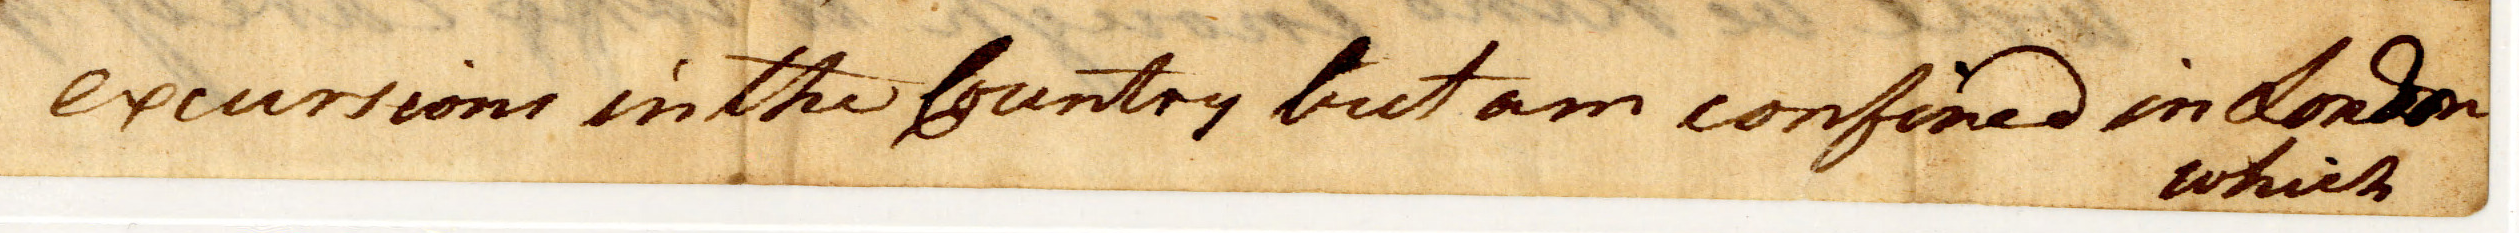excursions in the Country but am confined in London
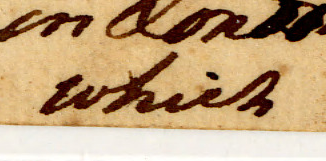which
